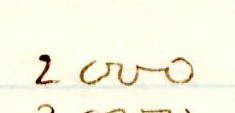2000
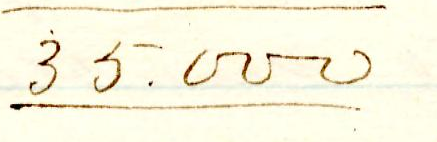35.000
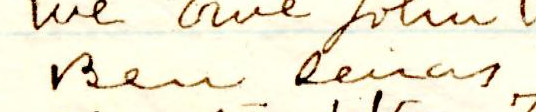Ben reinas
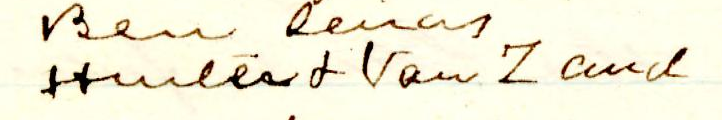Hulls & Van Z coud
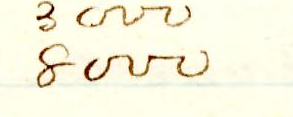8000
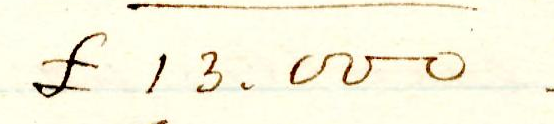£13.000
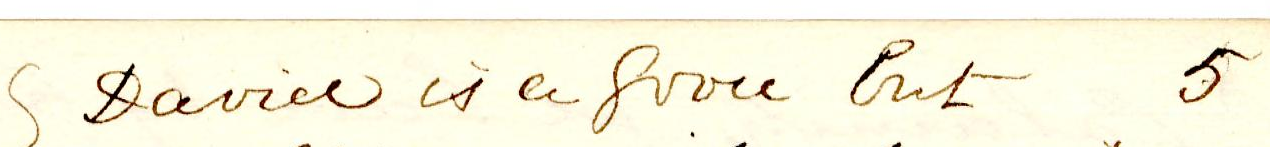David is a gone Out 5
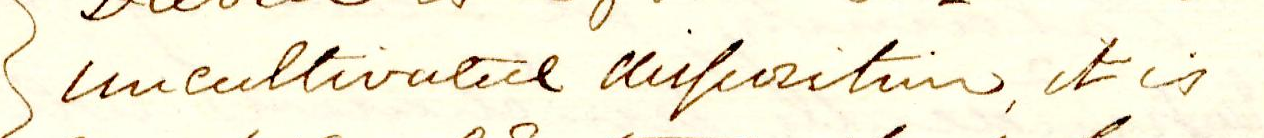uncultivated disposition, it is
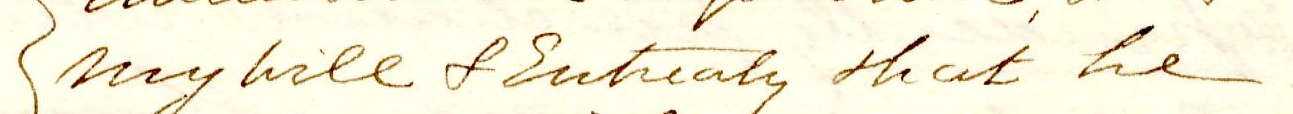my will & Entreaty that he
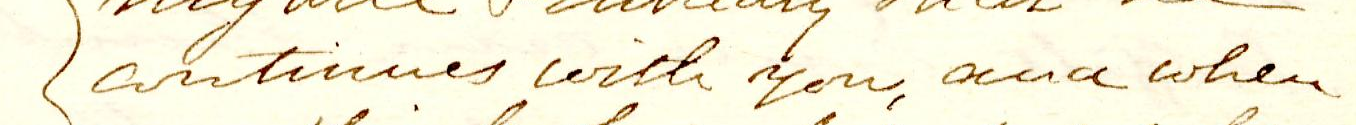continues with you, and when
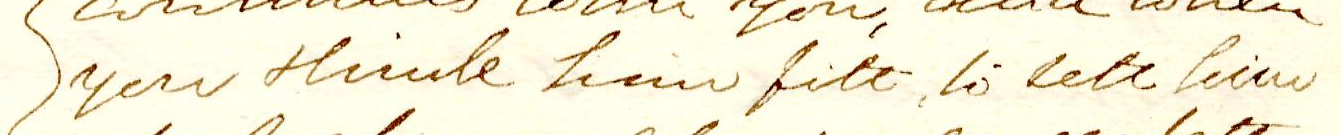you think him fitt to lett lecew
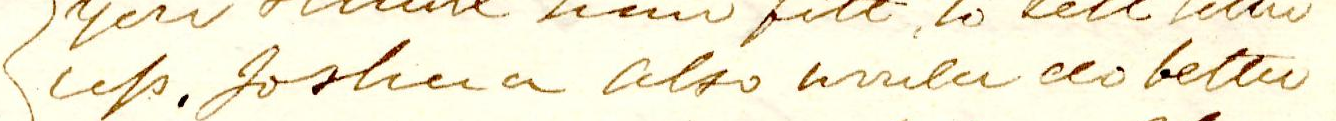less, Joshua also would do better
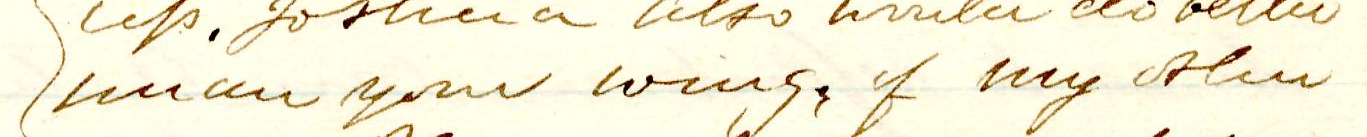under your wing of my slew
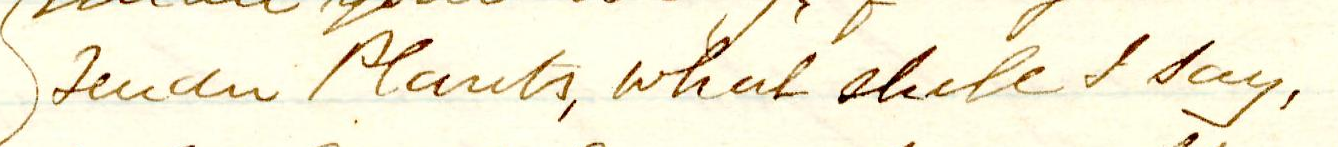Jeudan Plants, what shall I say,
